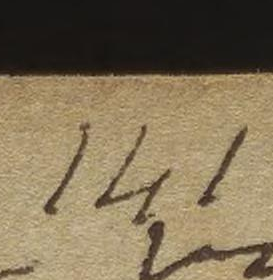141
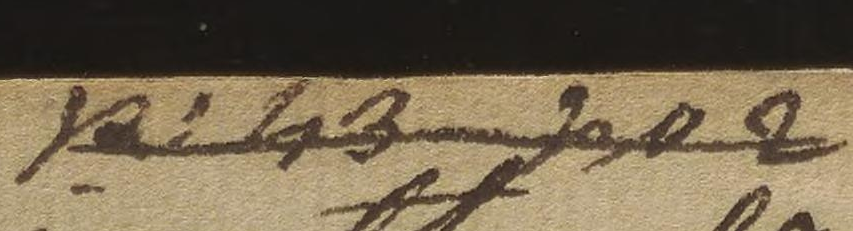p: 43 pg 2
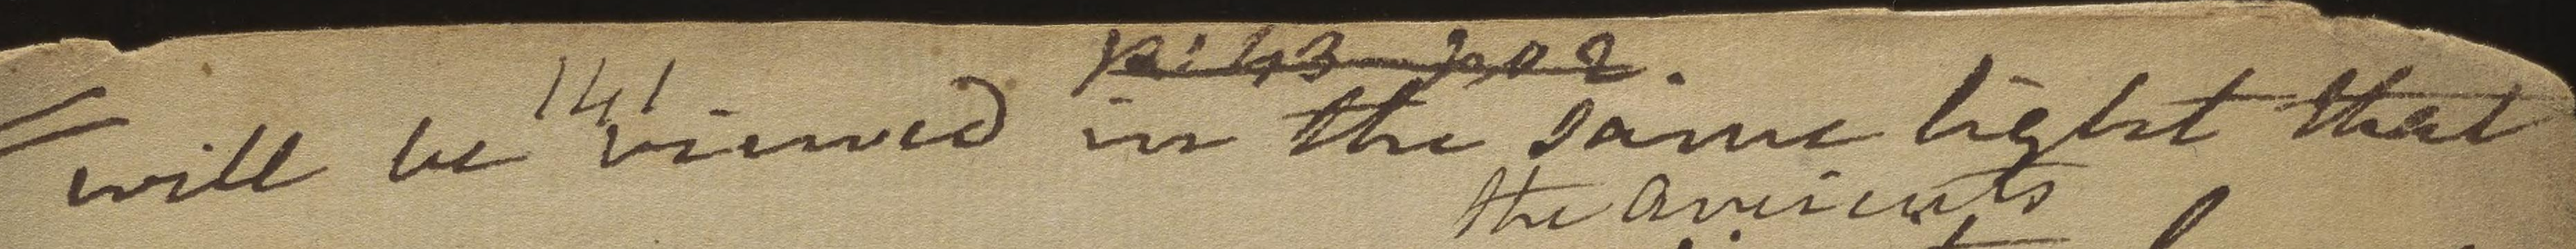will be viewed in the same light that
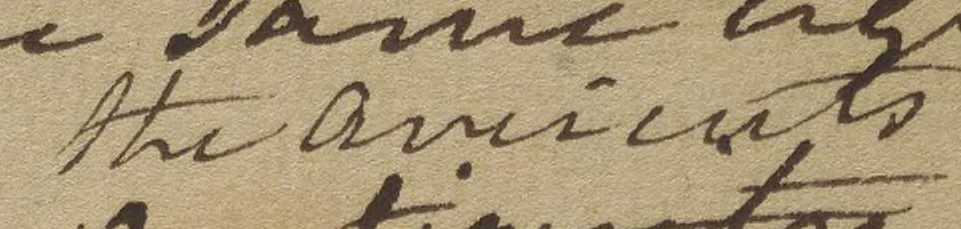the ancients
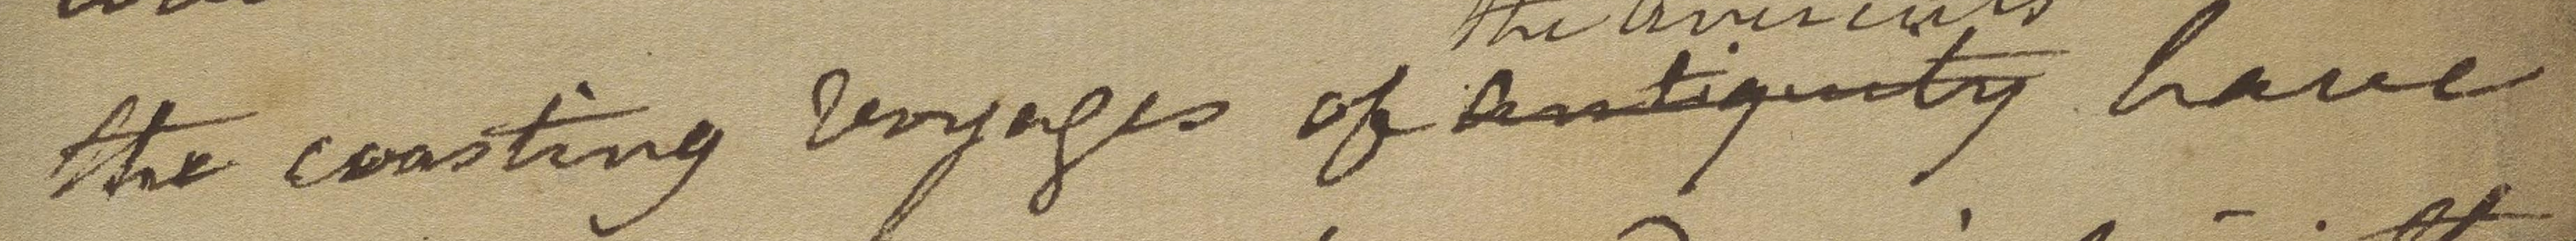the coasting voyages of [antiquity] have
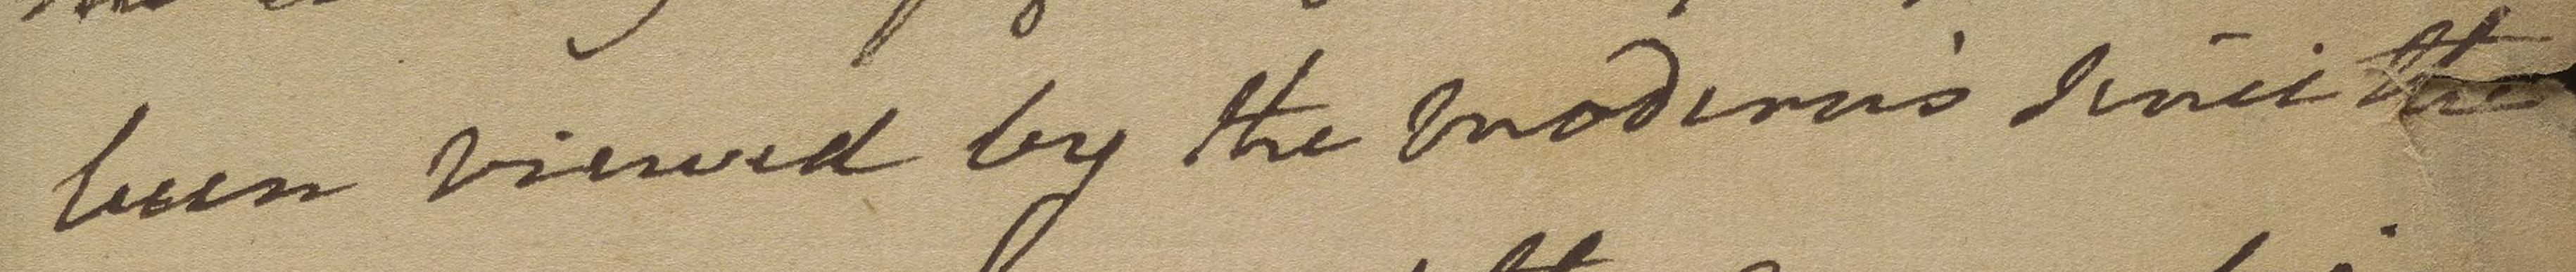been viewed by the Indians' since the
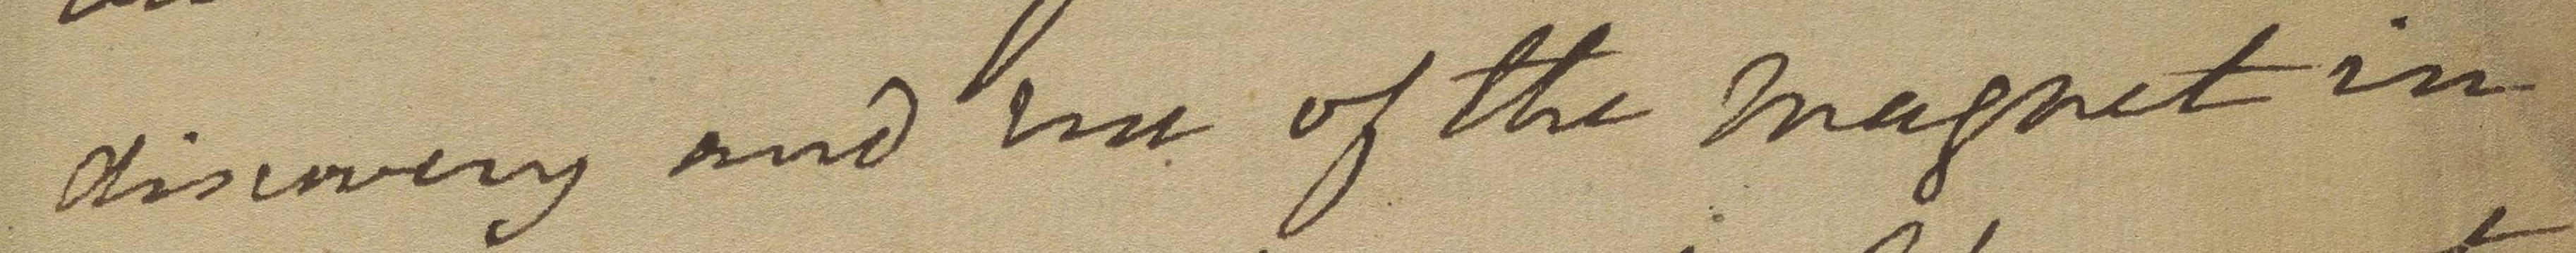discovery and use of the magnet in
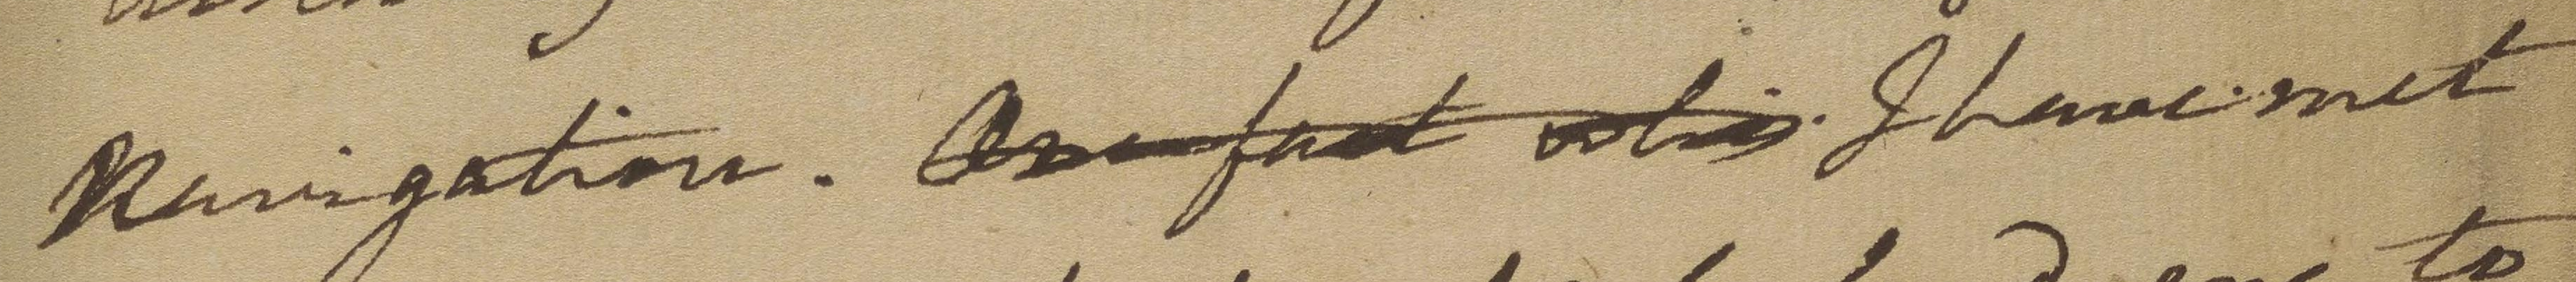Navigation. [One fact also] I have met
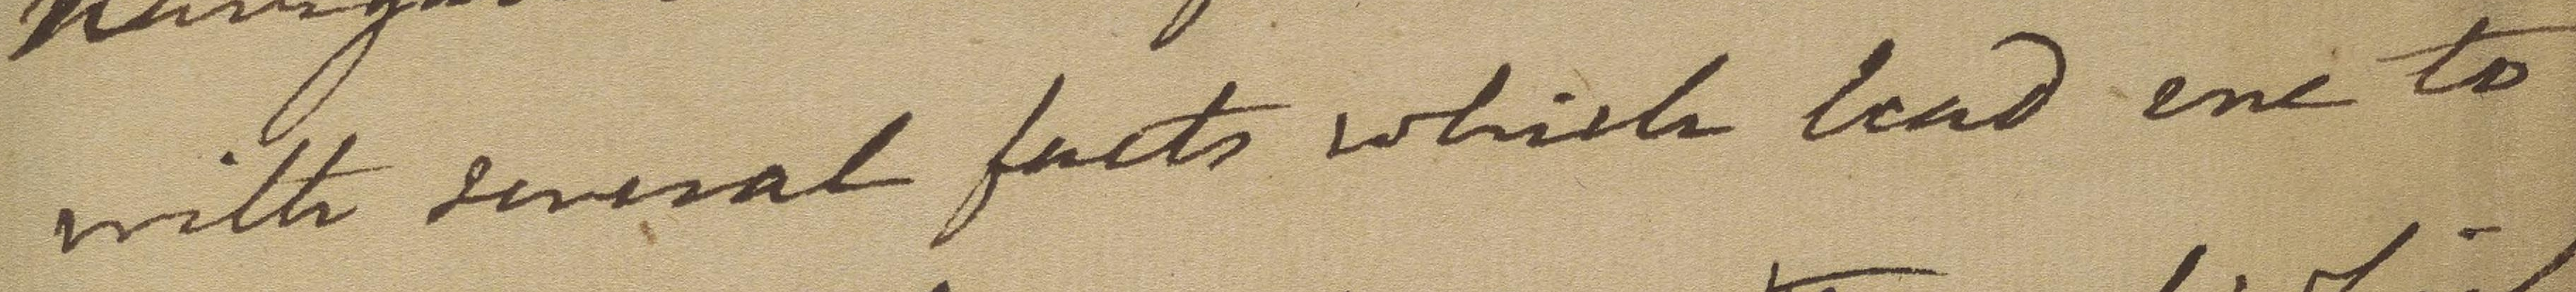with several facts which lead one to
